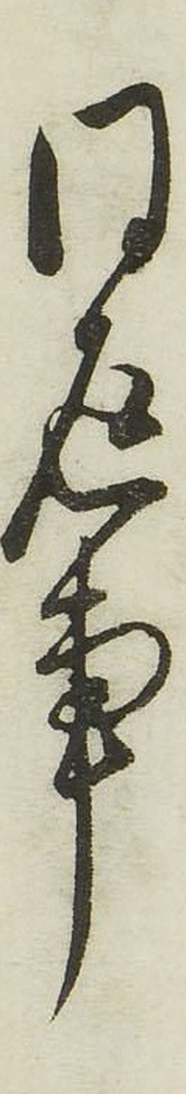同返事

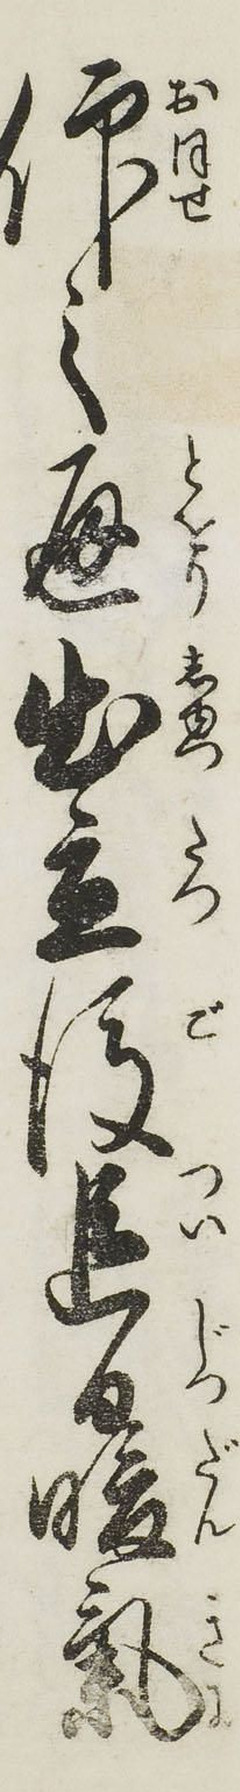仰之通出立後追日暖気
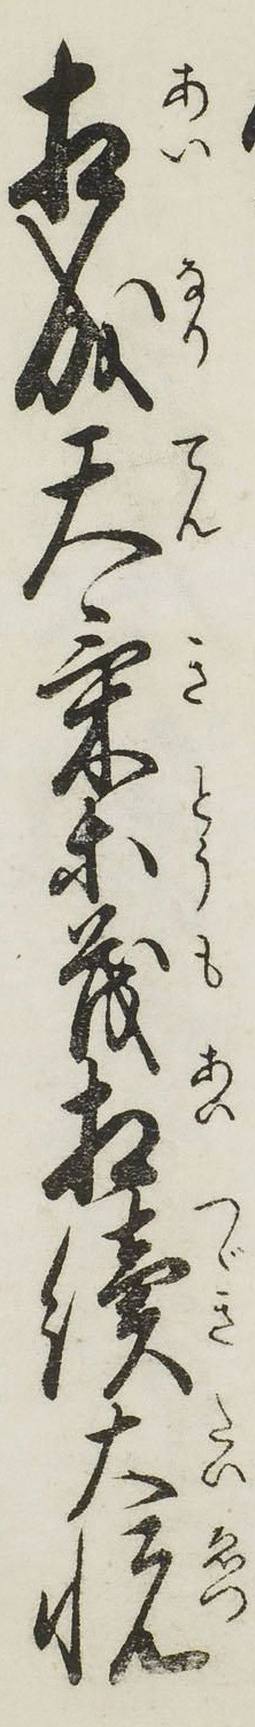相成天気等茂相続大悦

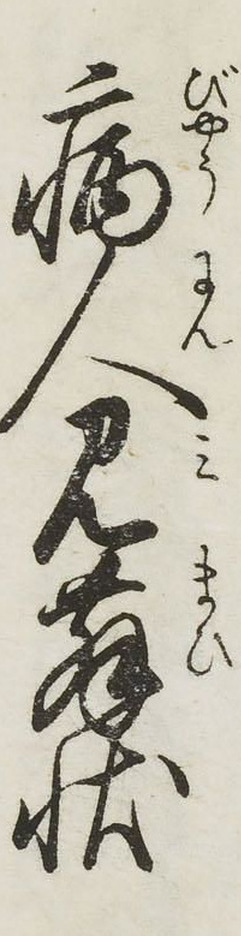病人見舞状
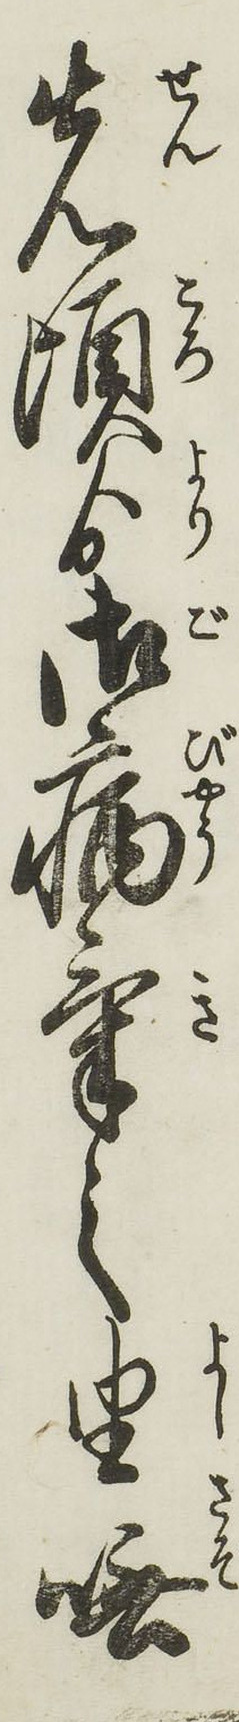先頃ゟ御病気之由嘸

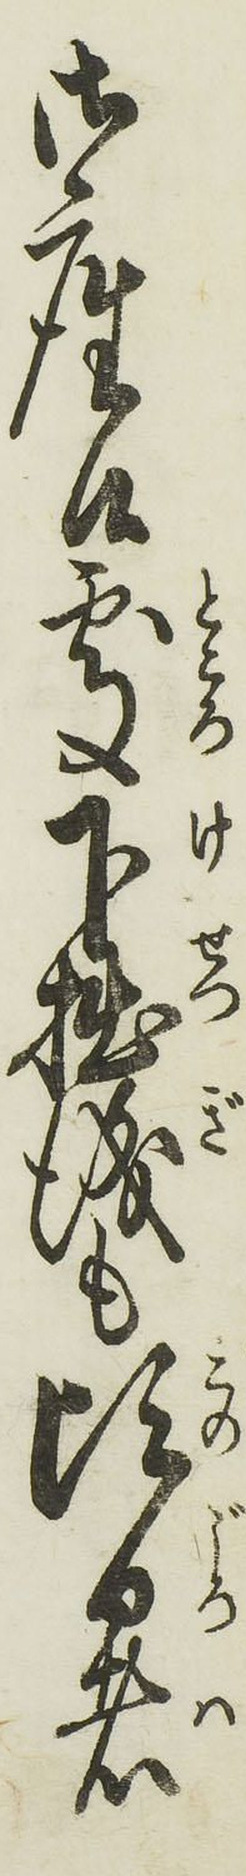御座候処下拙儀も頃日者
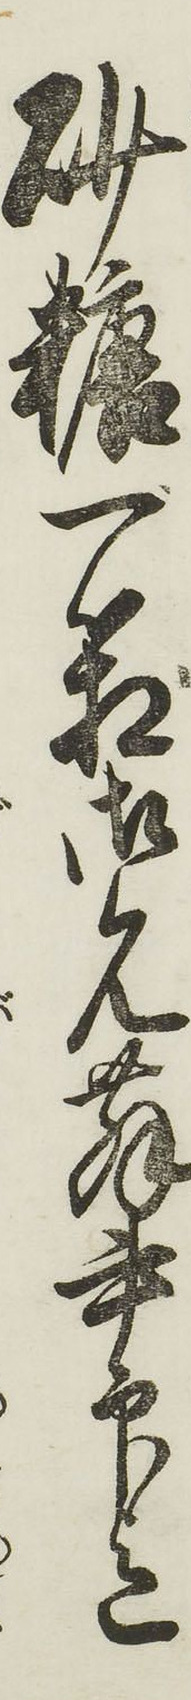砂糖一箱御見舞書印迄
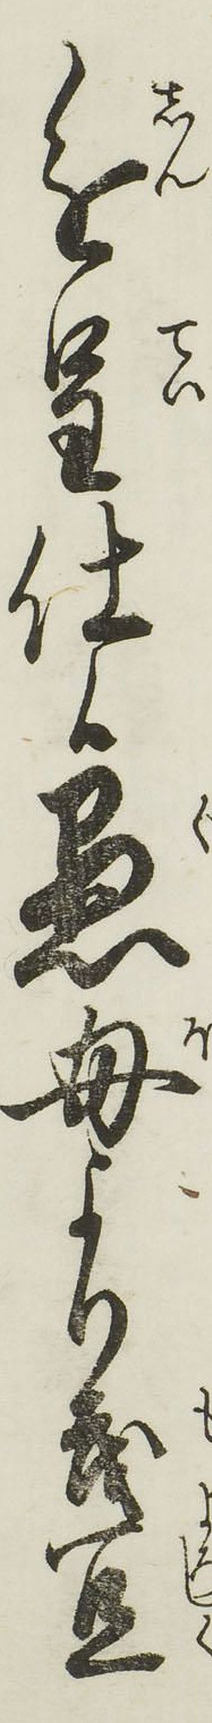進呈仕候愚母より茂宜

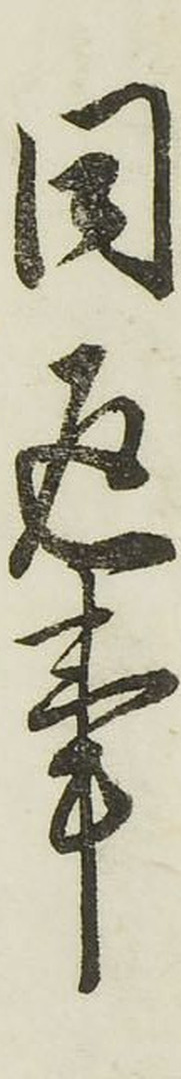同返事
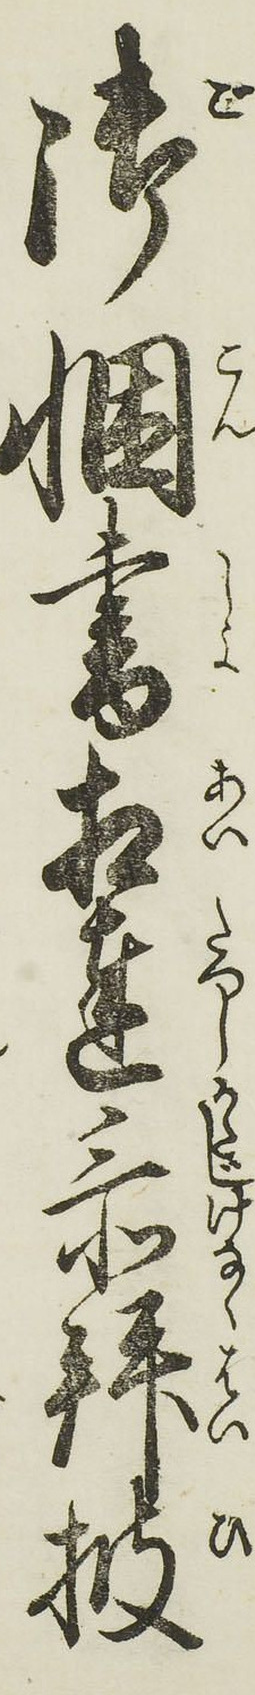御悃書相達忝拝披
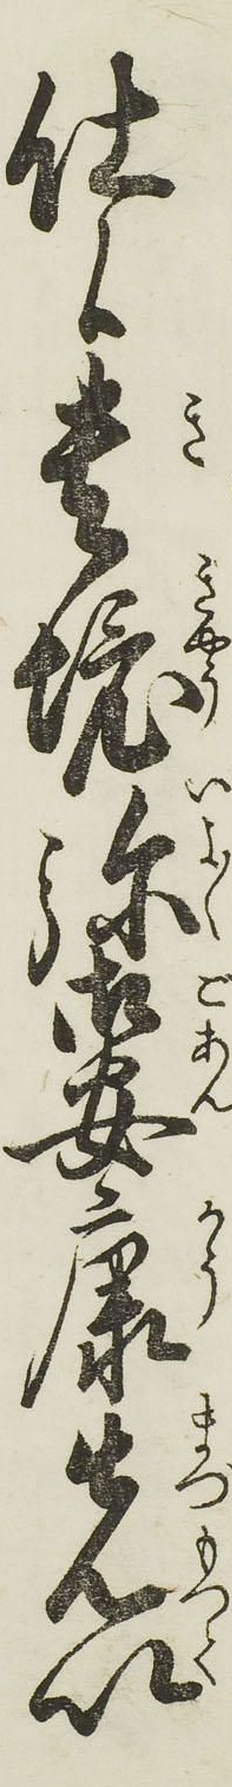仕候貴境弥御安康先以
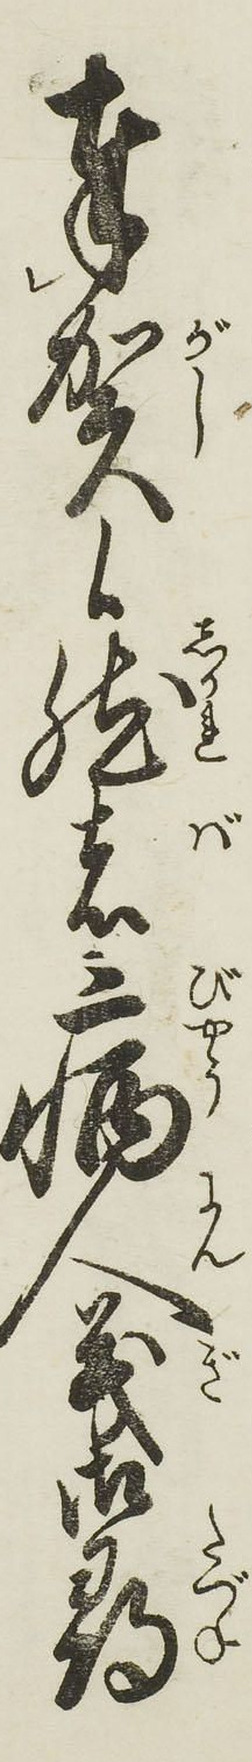奉賀候然者病人義御尋
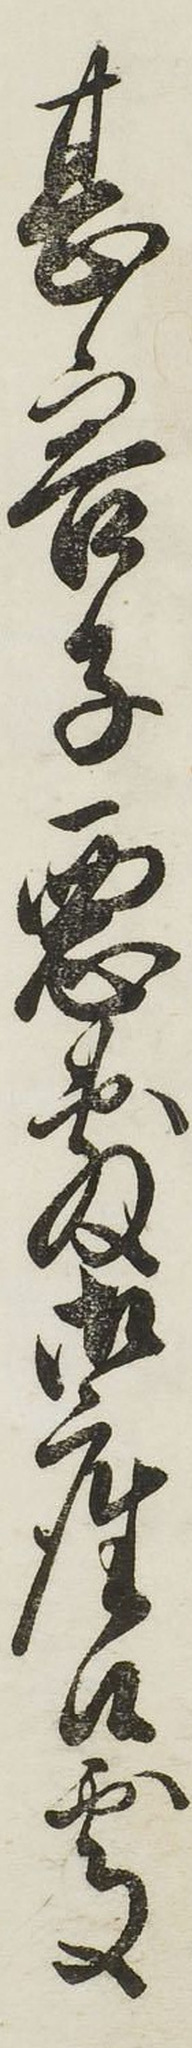甚容子悪敷御座候処
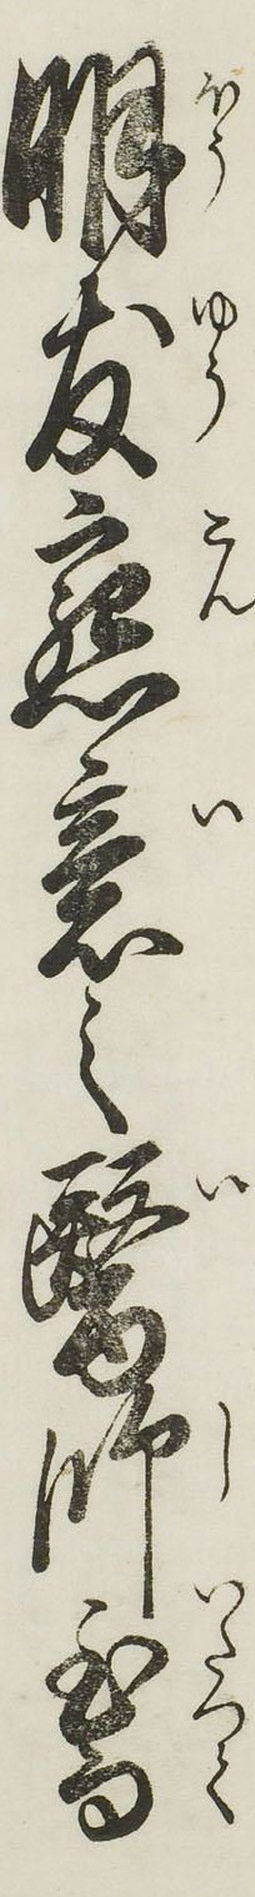朋友懇意之医師至而

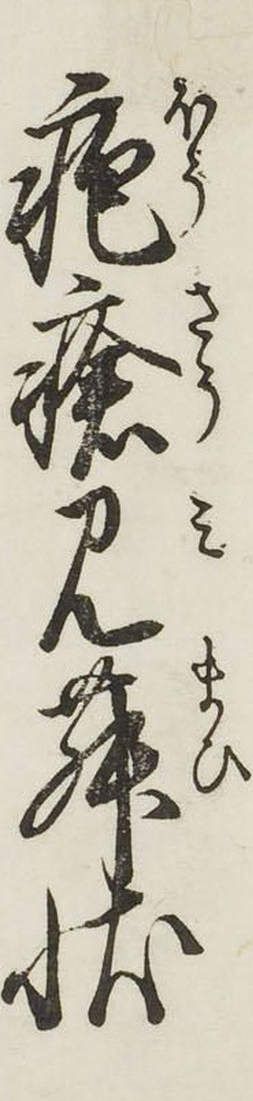疱瘡見舞状
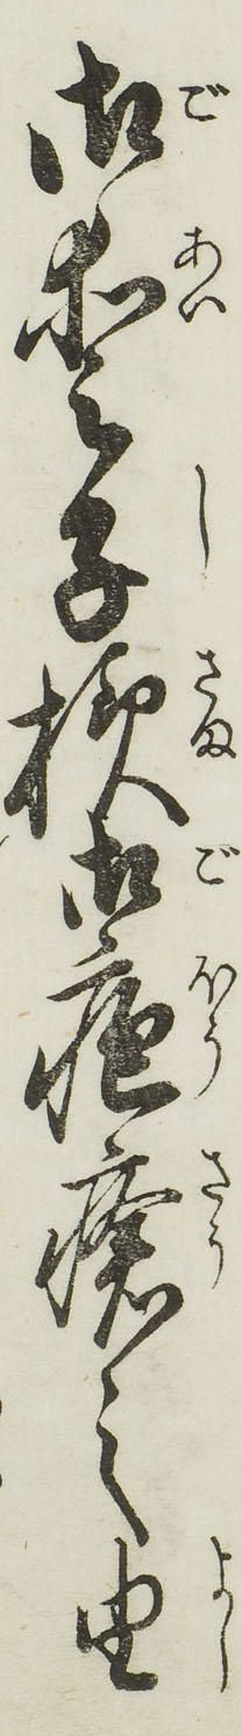御愛子様御疱瘡之由
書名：商人書翰便覧
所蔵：東京学芸大学教育コンテンツアーカイブ
